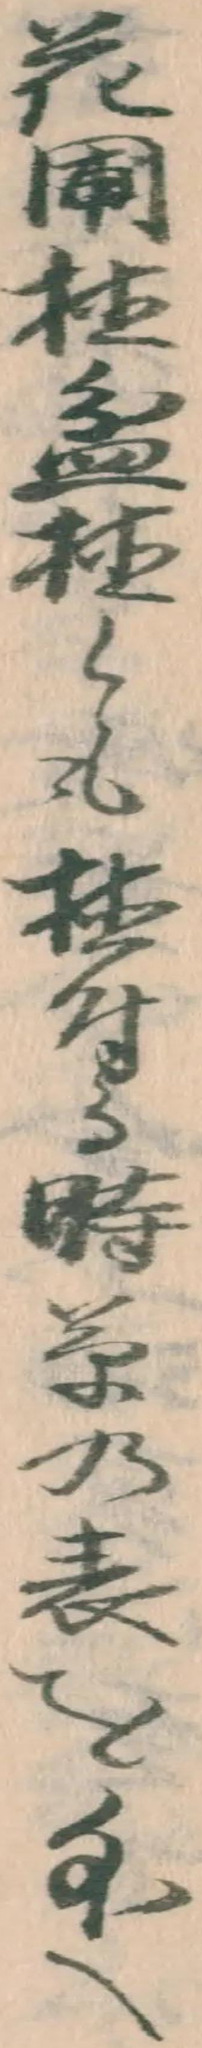花圃植盆植とも植付る時草の表を外へ
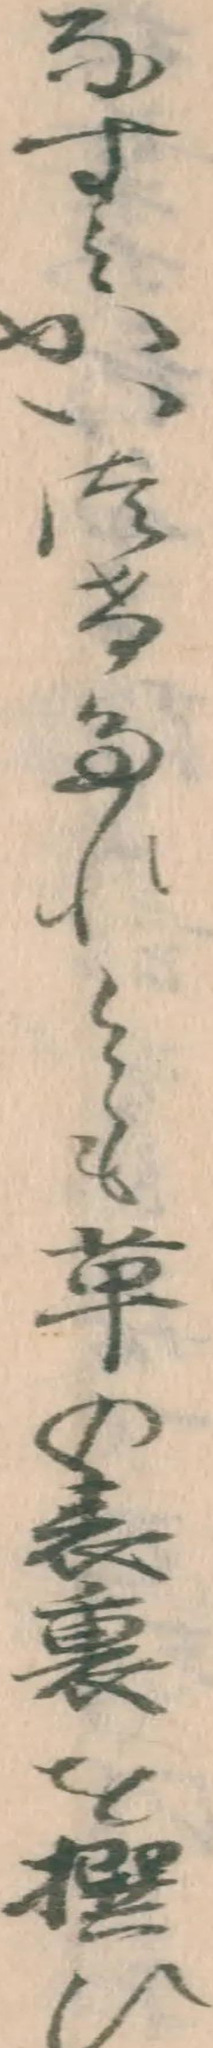なすとかいつけたれとも草の表裏を撰ひ
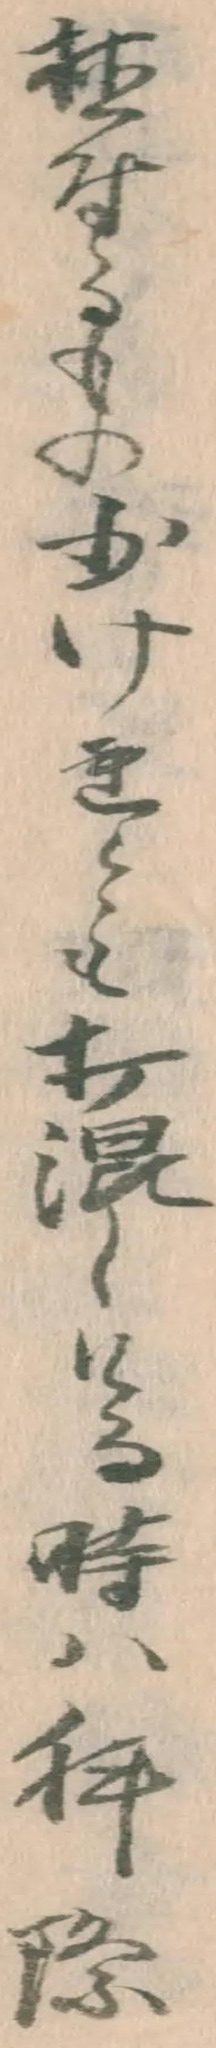植付るもの少けれとも打混しける時ハ科際
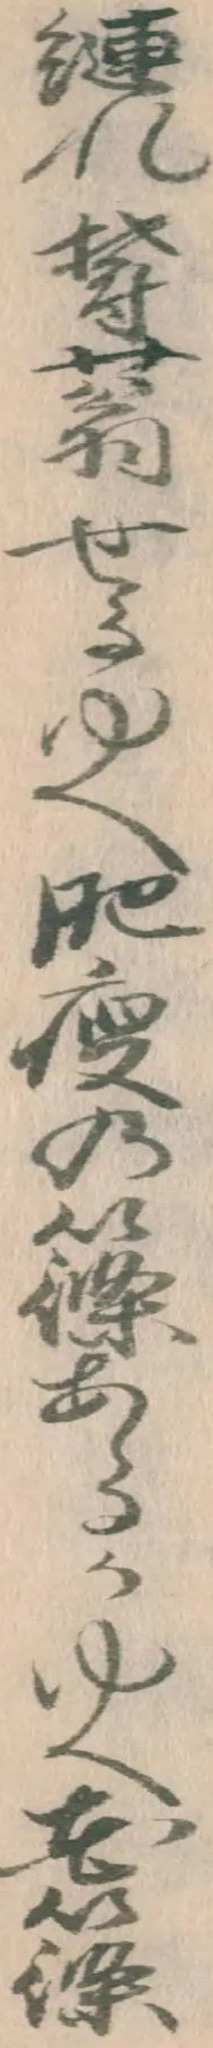縺れ欝嵡せるゆへ肥痩の篠あるかゆへ花篠
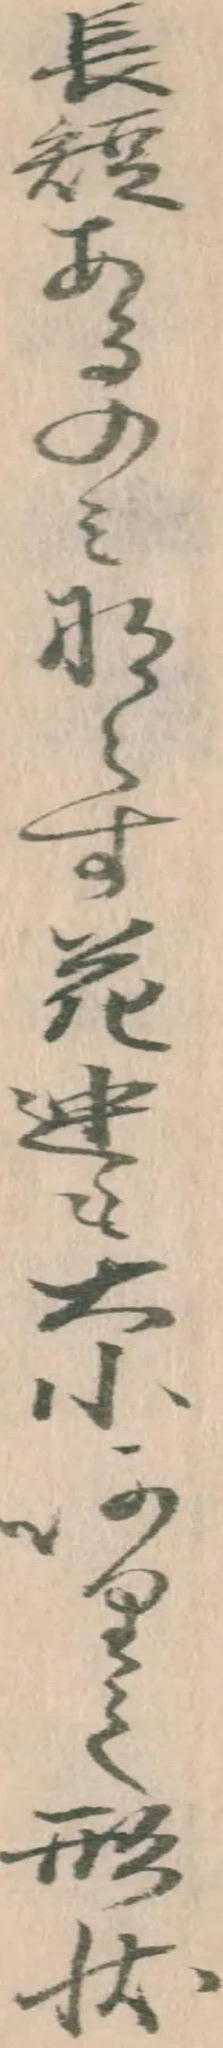長短あるのミならす花迚も大小ありて形状
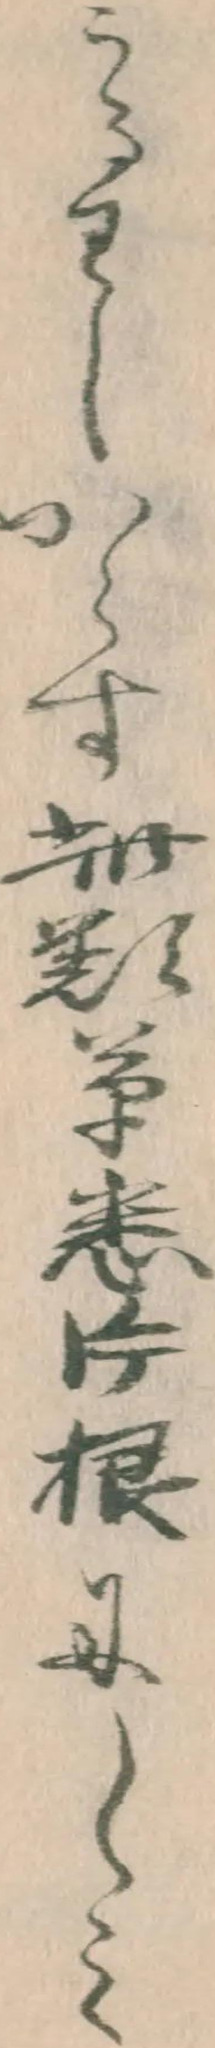うるわしからす此類草悉片根にして
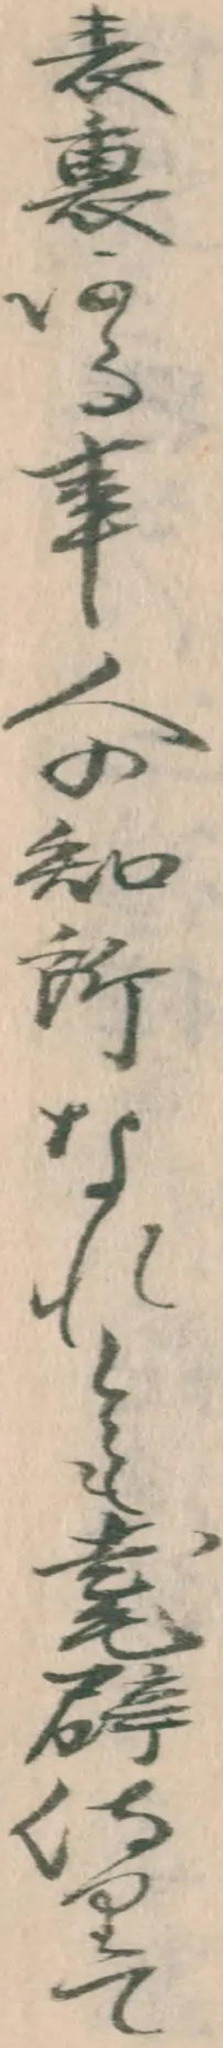表裏ある事人の知所なれとも耄碌侍りて
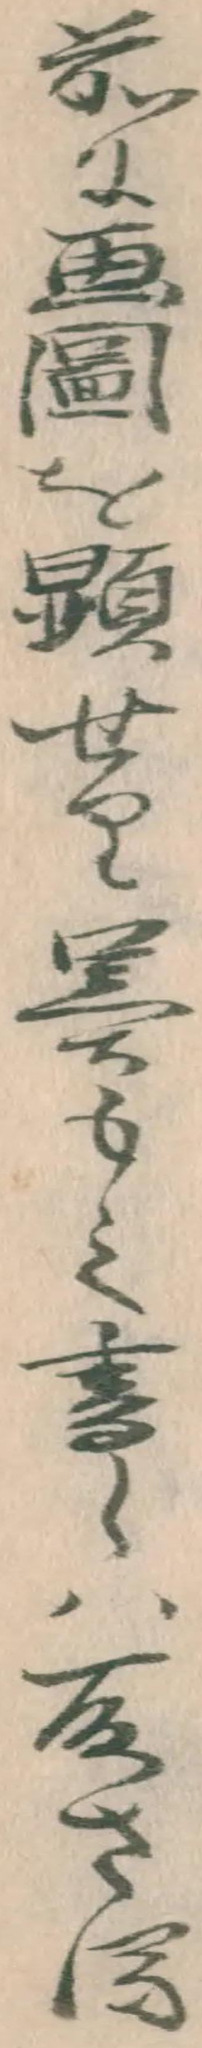前に画図を顕せるも是もて書くハ及さる
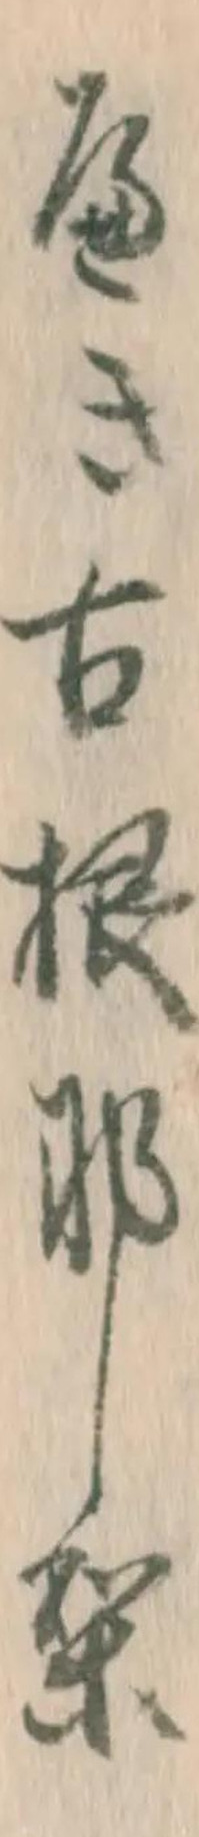へき古根なり
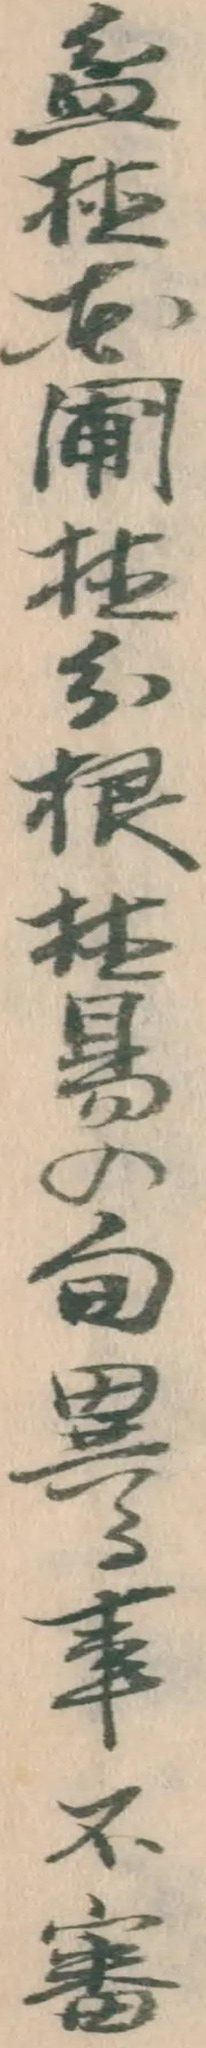盆植花圃植分根植易の旬異る事不審

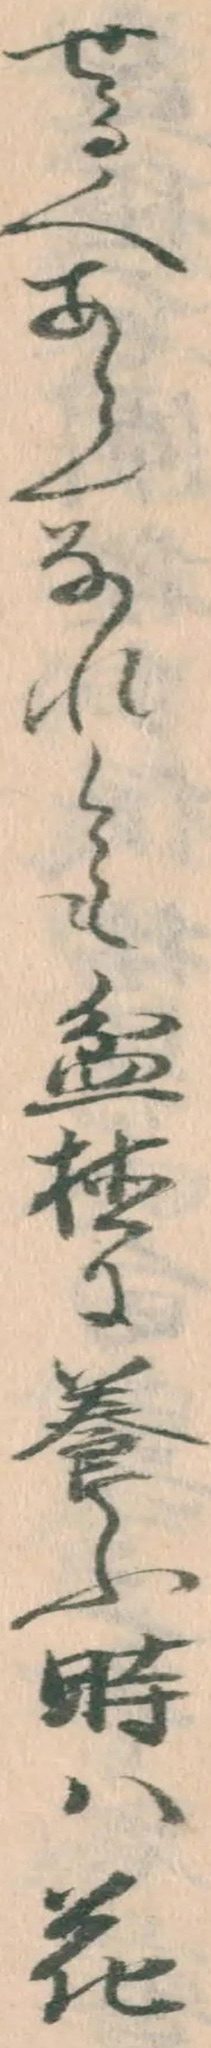せる人あらんなれとも盆植に養ふ時ハ花
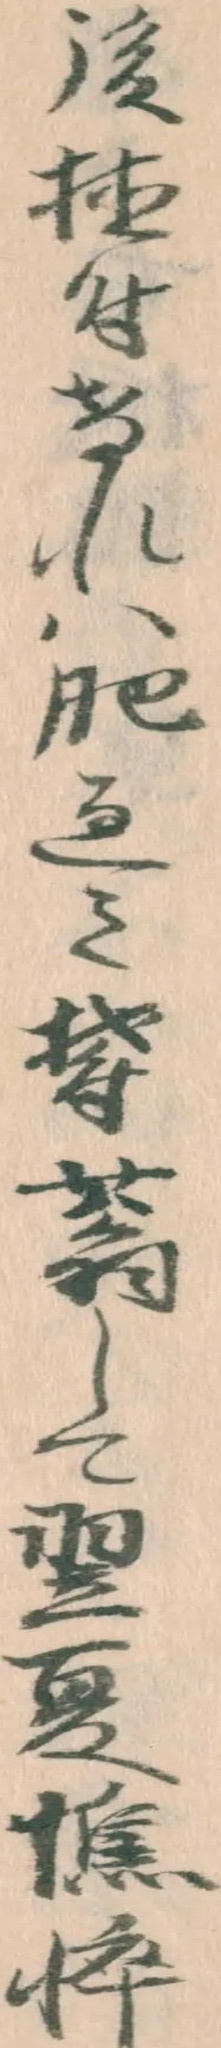後植付なれハ肥過て欝嵡して翌夏憔悴
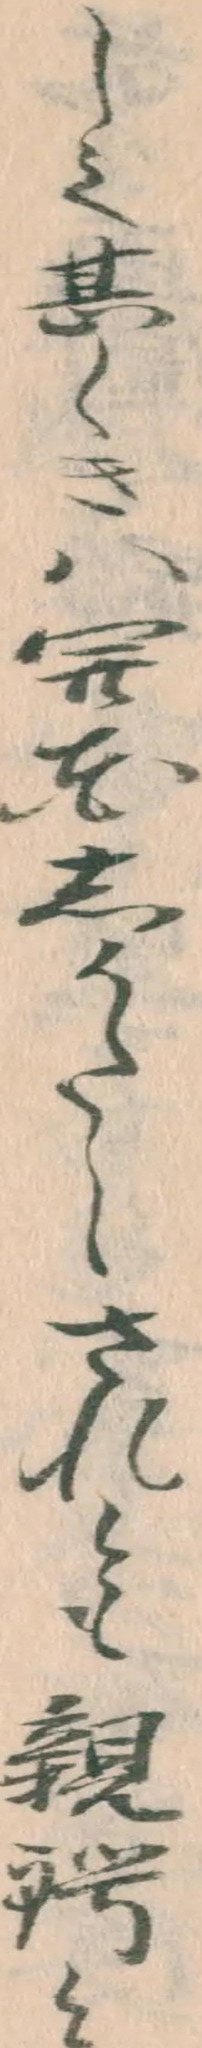して甚しきハ開花しかたしされｔとも親鍔と
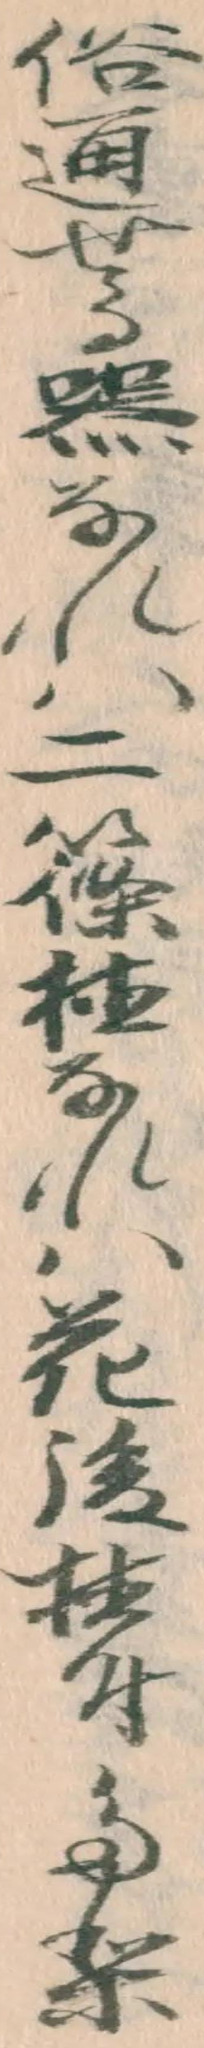俗通せる器なれハ二篠植なれハ花後植付たり
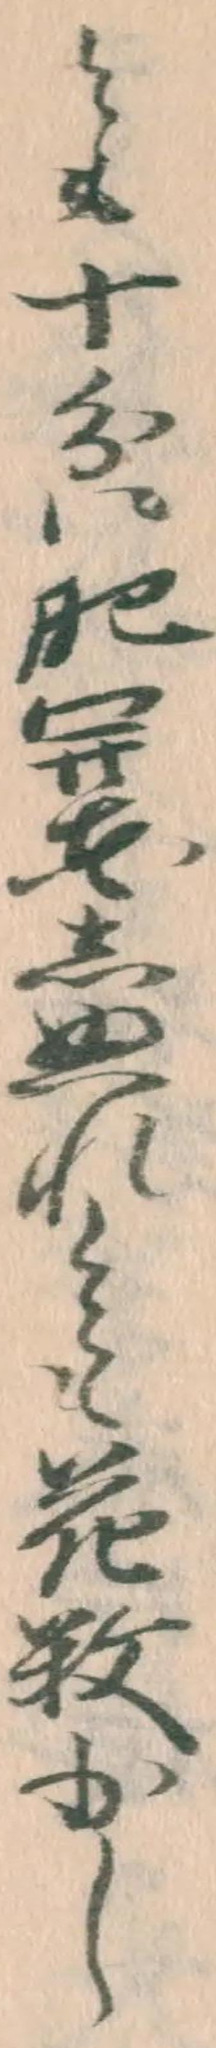とも十分に肥開花しぬれとも花数少し
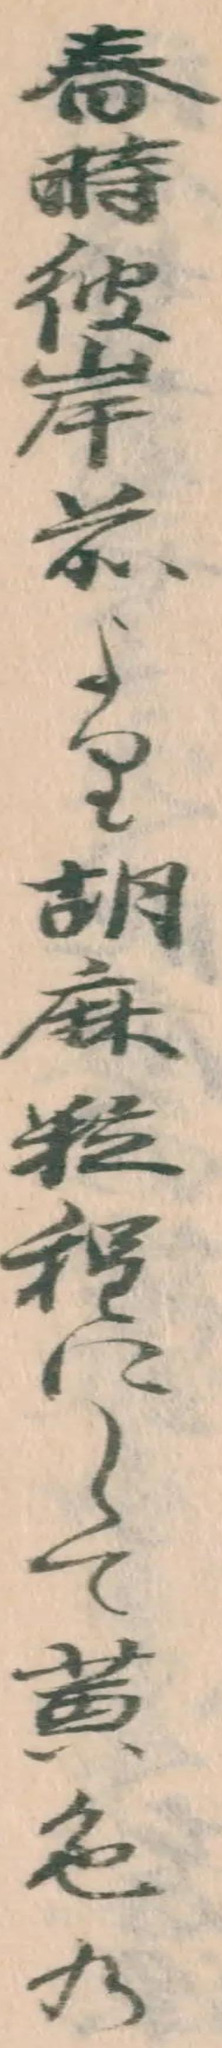春時彼岸前より胡麻粒程にして黄色の
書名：花菖培養録
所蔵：国立国会図書館 National Diet Library, JAPAN
